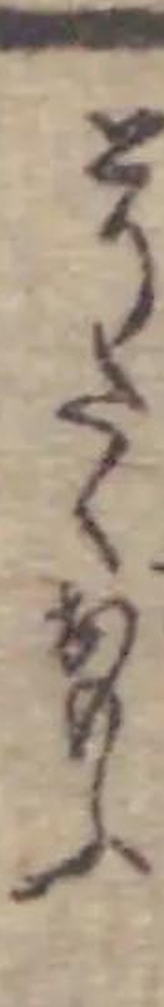とりたくおもふ
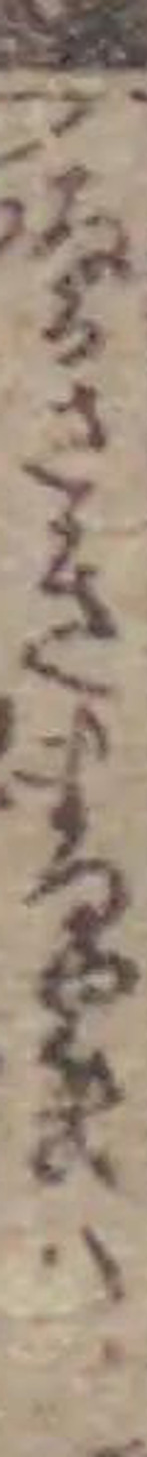なかさきまるやまは
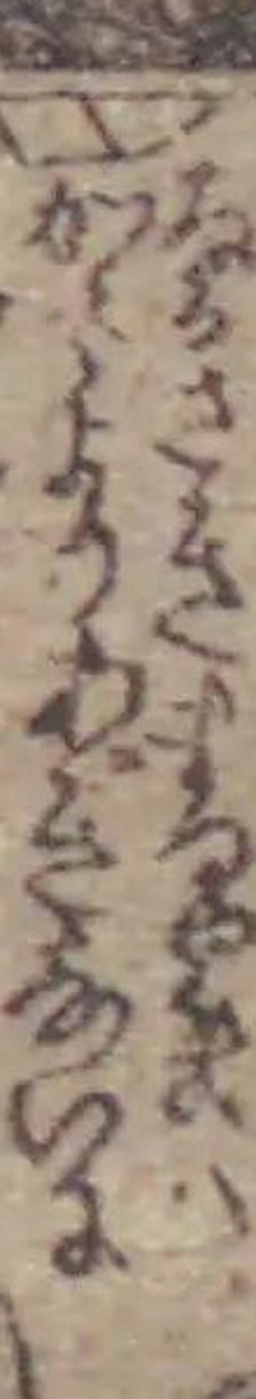からよりあきないに
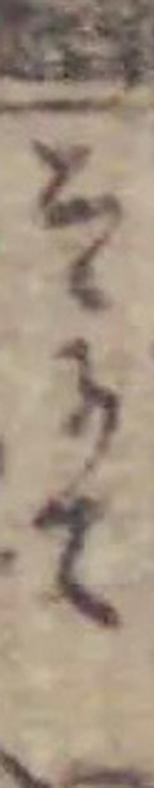こゝにて
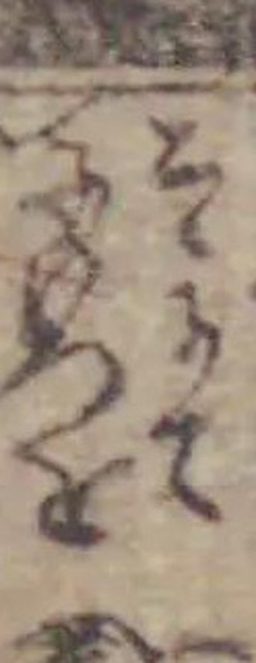にもつを
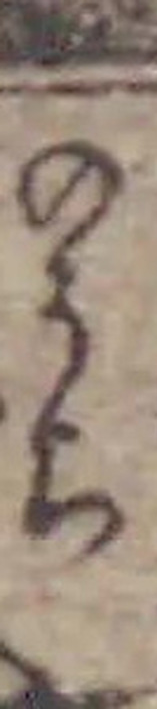のうち
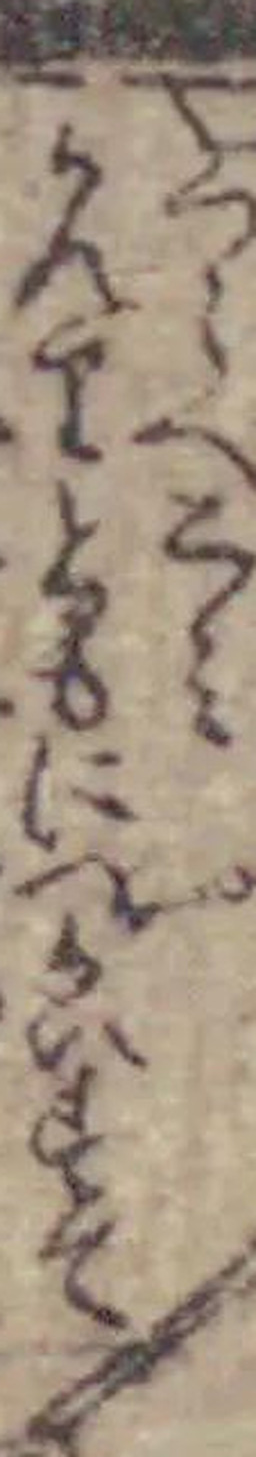かんりともにへかいすて
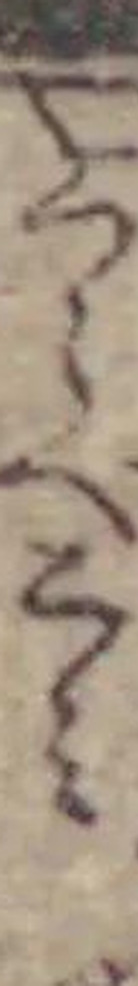くらべこみ
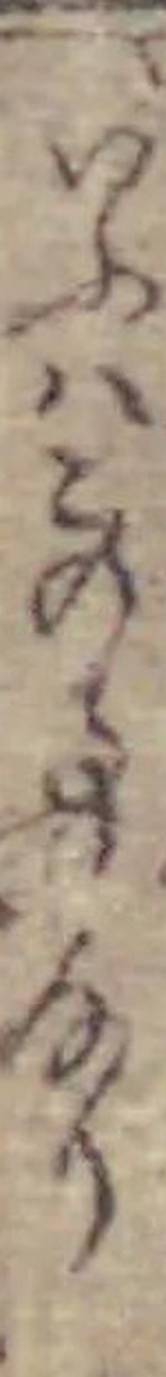いふはこの事なり
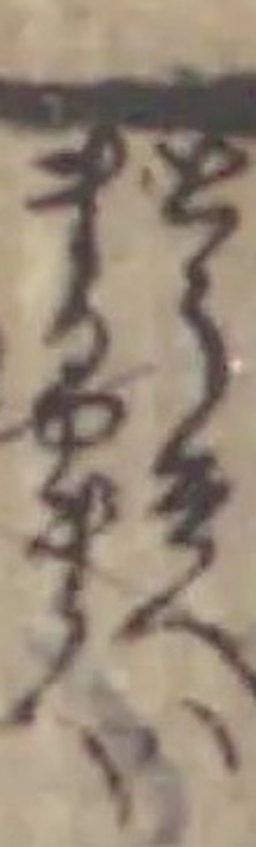まるやまへ
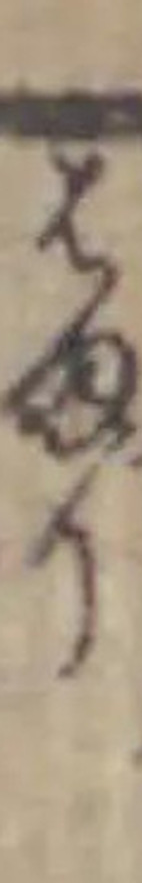はまり
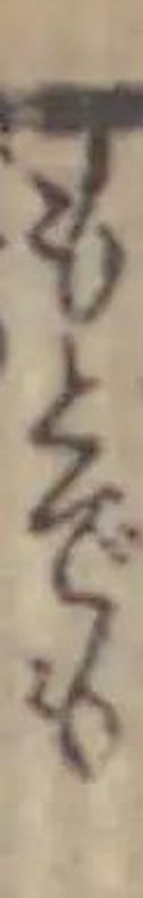もとでも
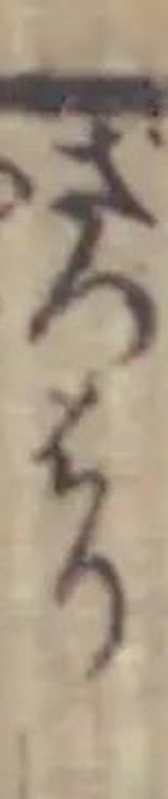さつはり
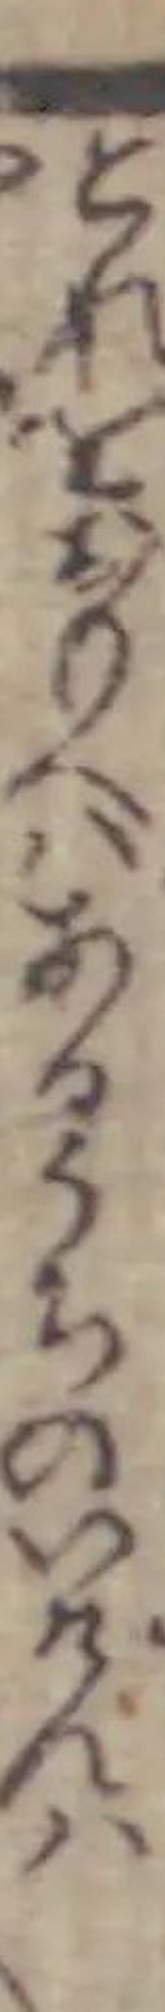これをおもへはあるうちのいけんは
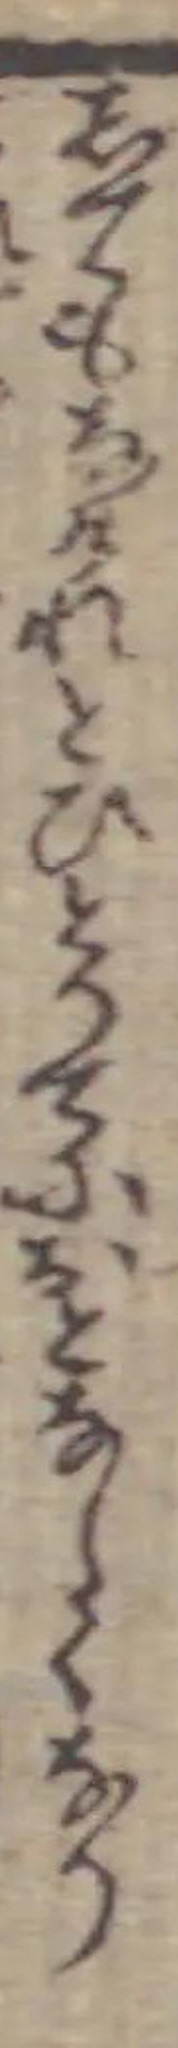してもなけれとひとりてにおとなしくなり
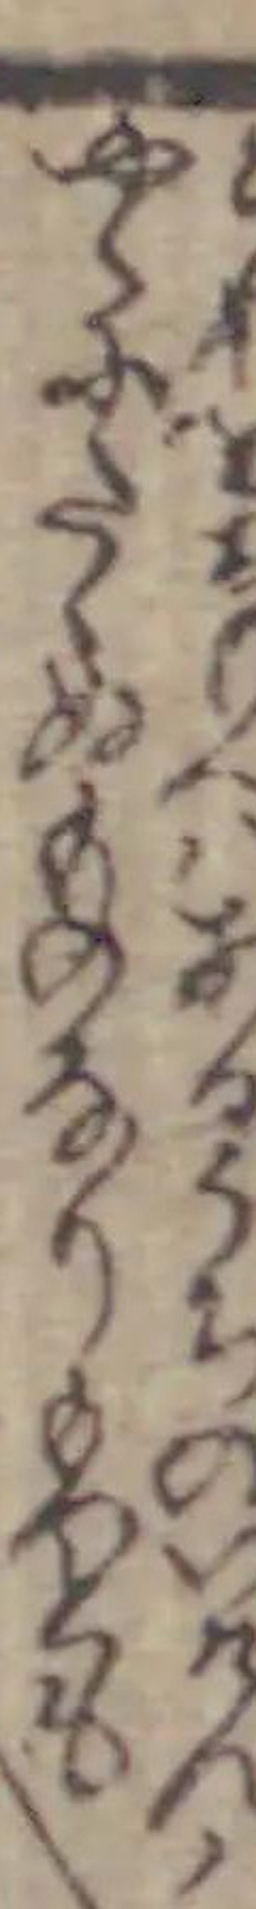やくにたゝぬものなりもつとも
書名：間違月夜鍋 2巻
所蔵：国立国会図書館 National Diet Library, JAPAN
